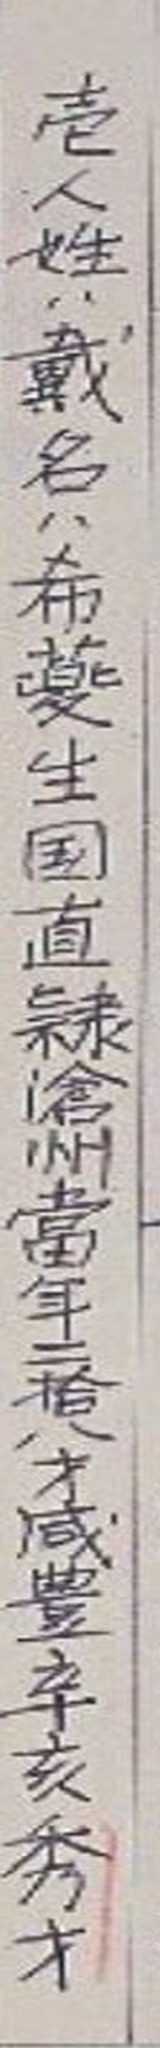壱人姓は戴名は希虁生国直隷滄州当年二拾八才咸豊辛亥秀才
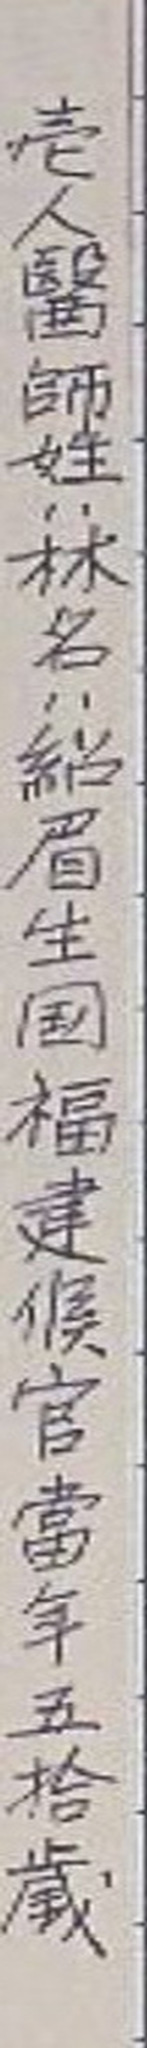壱人医師姓は林名は紹眉生国福建候官県当年五拾才
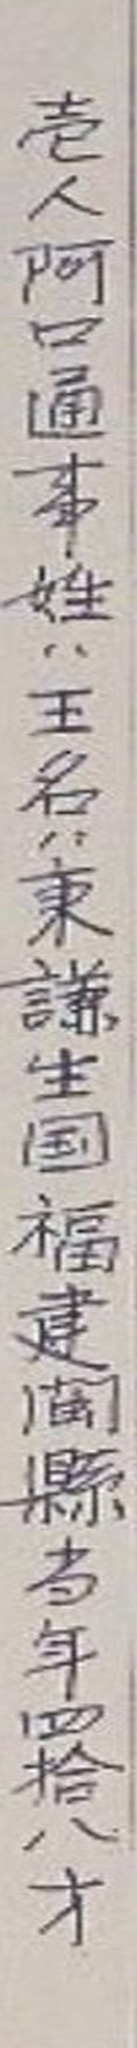壱人阿口通事姓は王名は東謙生国福建閩県当年四拾八才
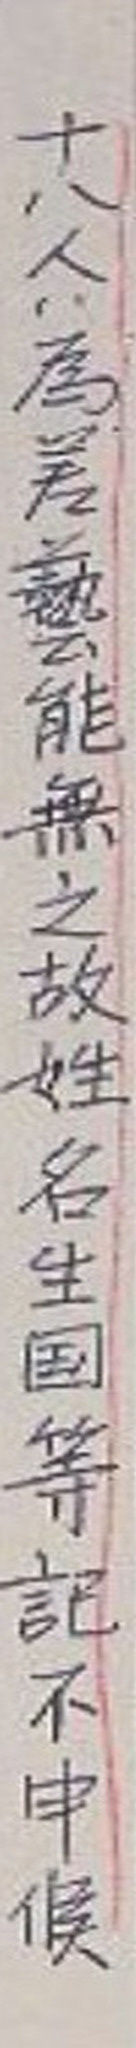十八人は為差芸能無之故姓名生国等記不申候
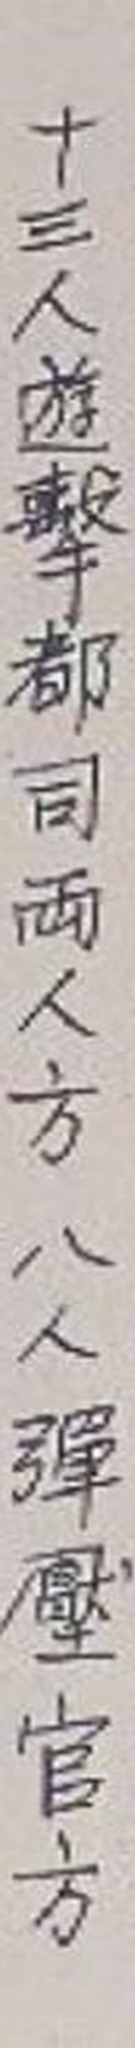十三人遊撃都司両人方八人弾圧官方
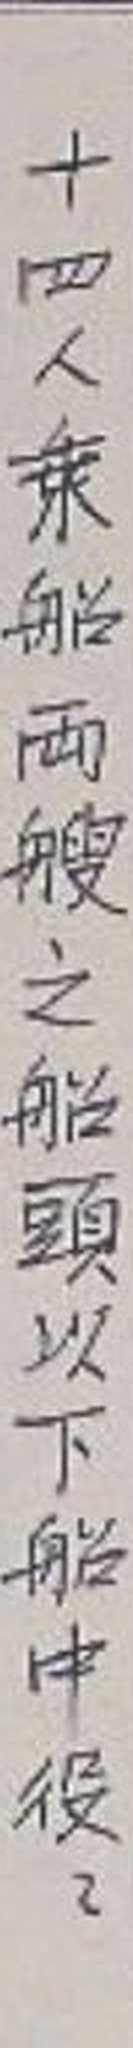十四人乗船両艘之船頭以下船中役々
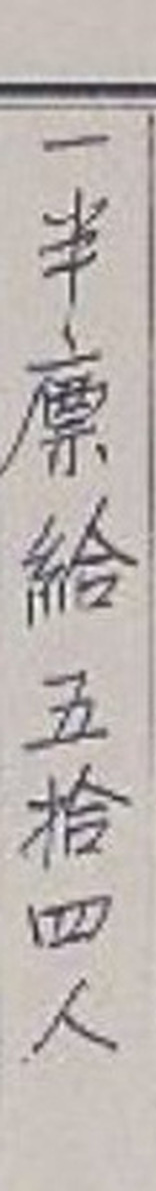一半𢊣給五拾四人
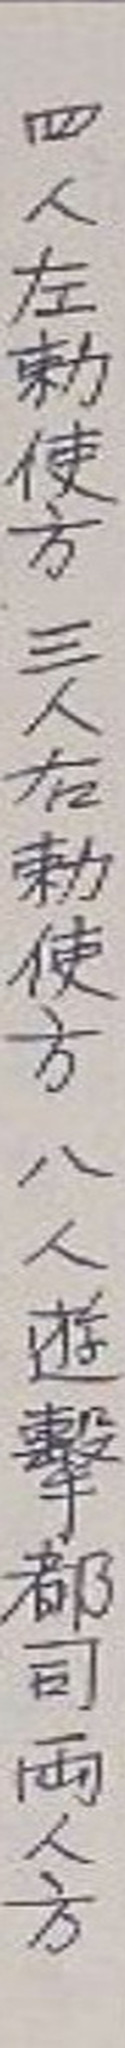四人左勅使方三人右勅使方八人遊撃都司両人方
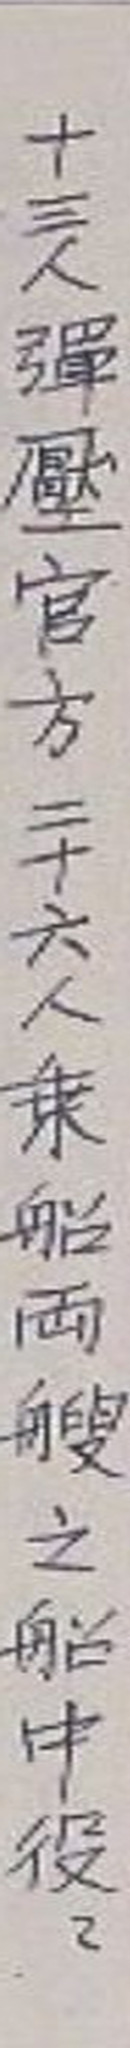十三人弾圧官方二十六人乗船両艘之船中役々
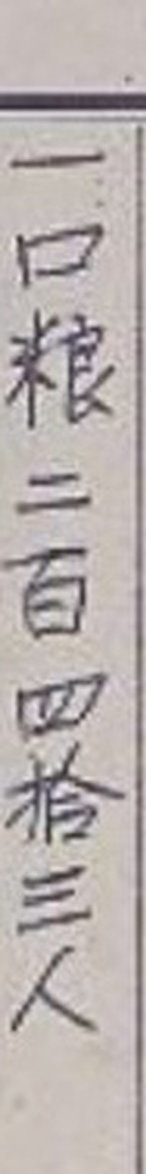一口粮二百四拾三人
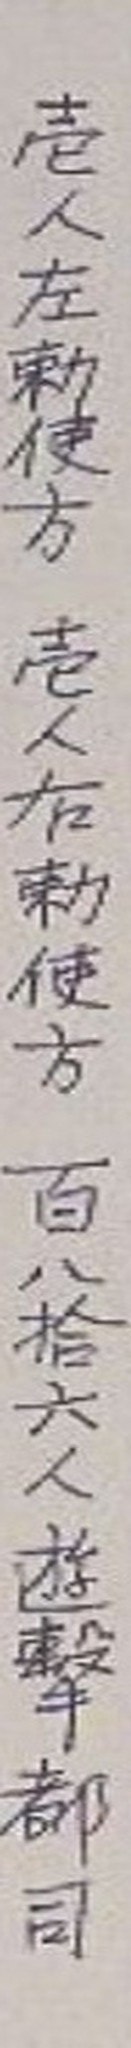壱人左勅使方壱人右勅使方百八拾六人遊撃都司
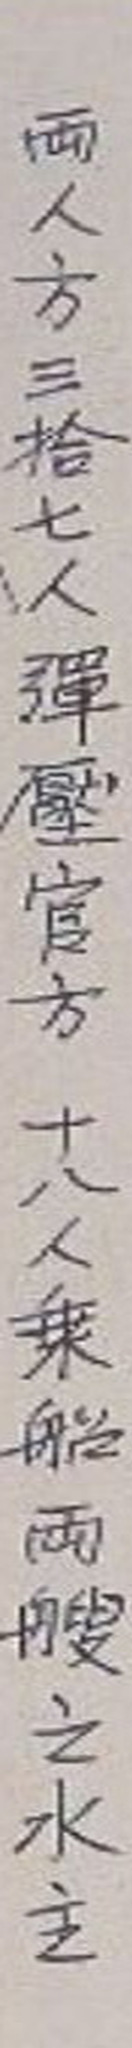両人方三拾七人弾圧官方十八人乗船両艘之水主

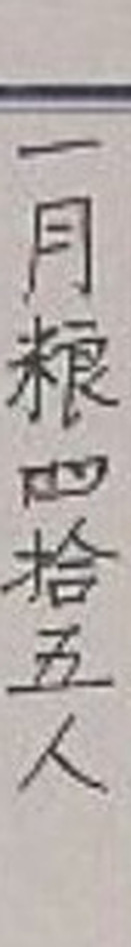一月粮四拾五人
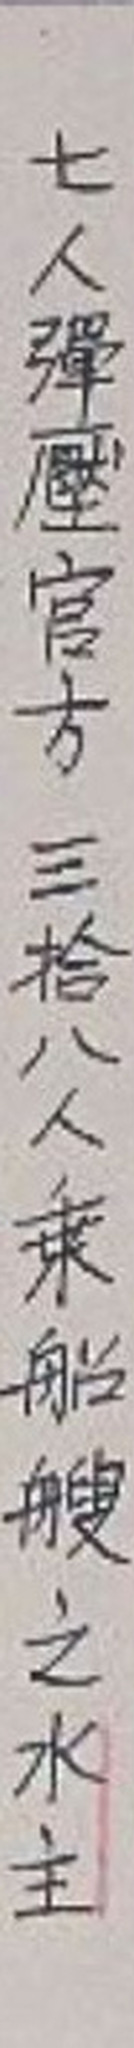七人弾圧官方三拾八人乗船艘之水主
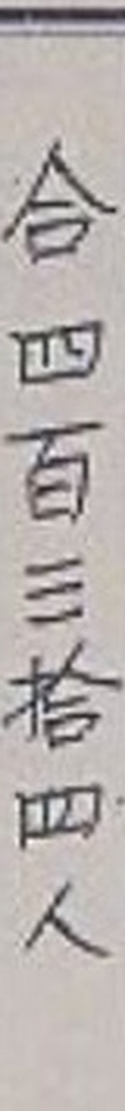合四百三拾四人
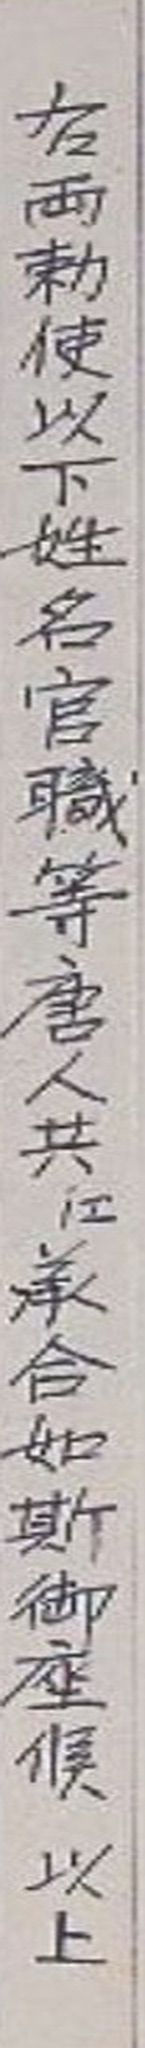右両勅使以下姓名官職等唐人共え承合如斯御座候
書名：支那冊封使来琉諸記 下巻
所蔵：University of the Ryukyus Library
